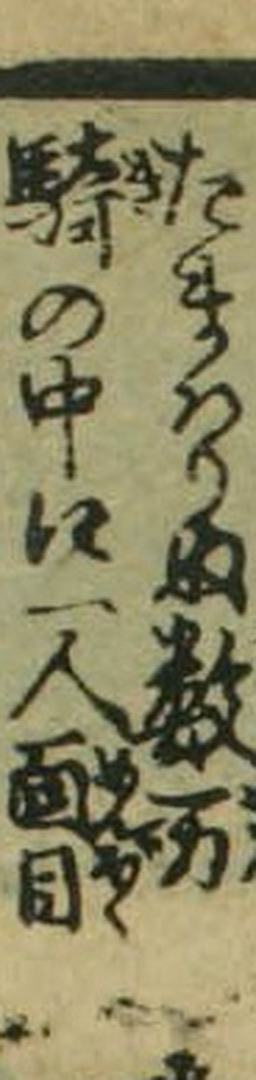騎の中に一人面目
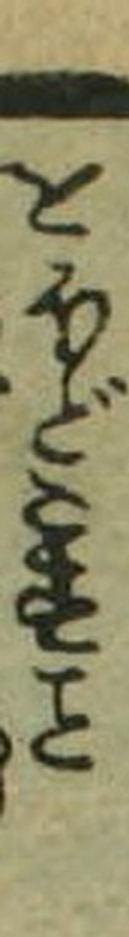をほどこすこと
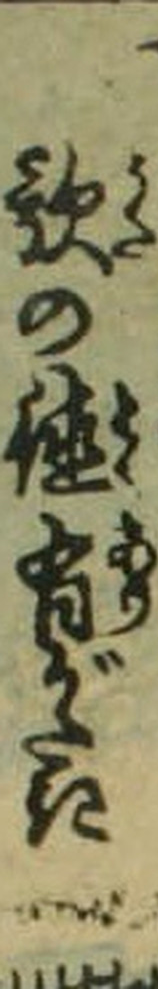歌の徳有がたき
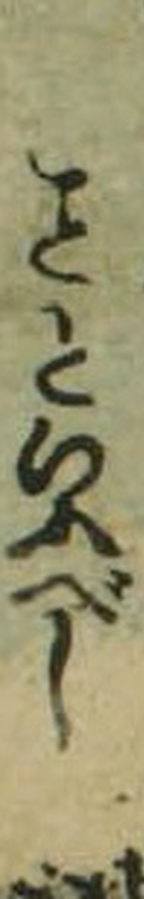ことといふべし

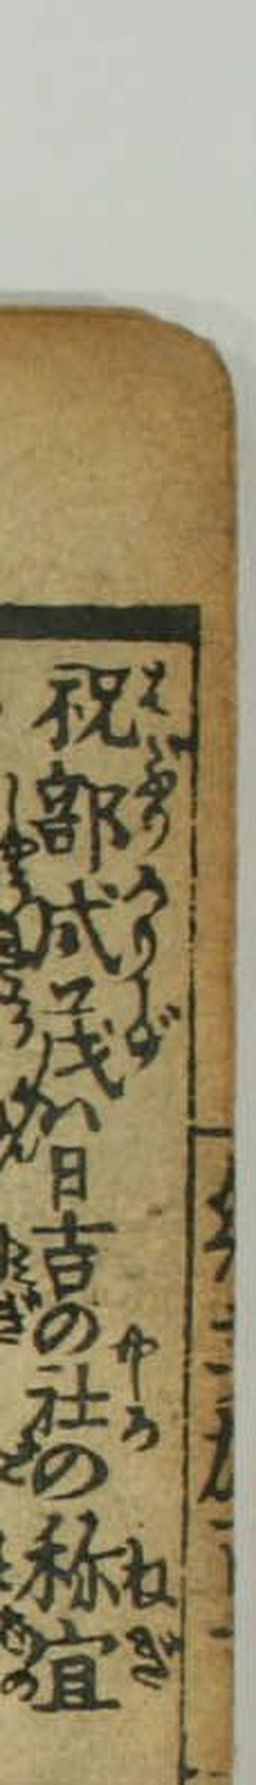祝部成茂は日吉の社の称宜
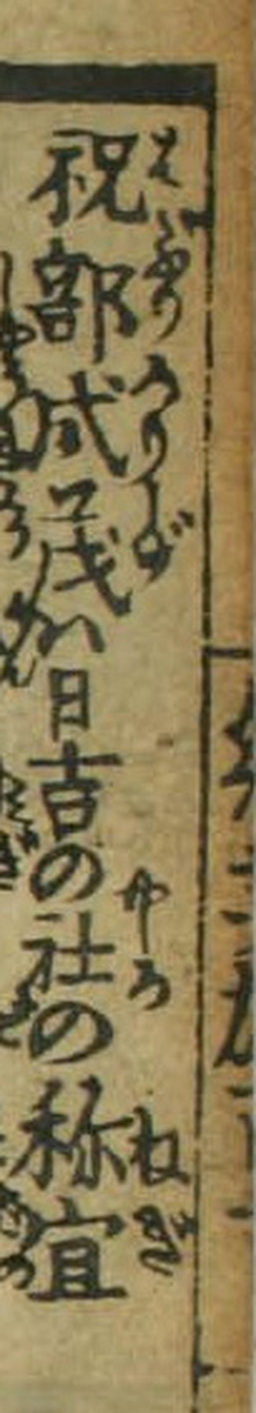祝部成茂は日吉の社の称宜
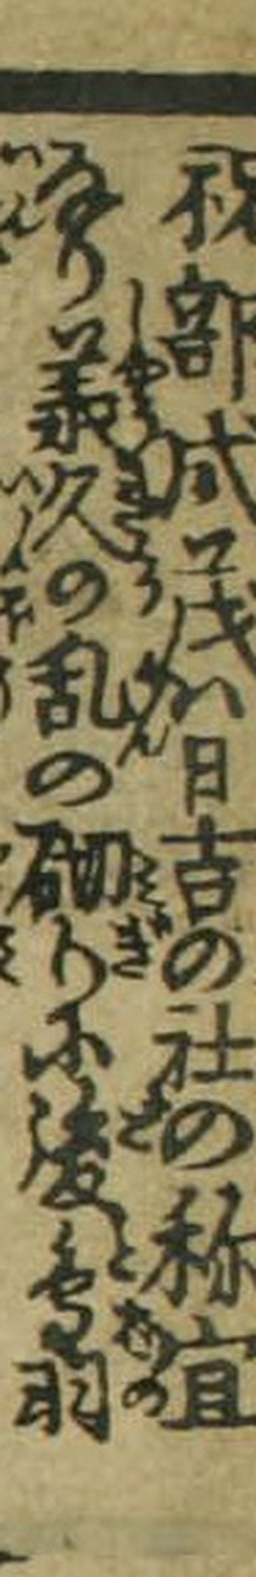なり承久の乱の砌りに後鳥羽
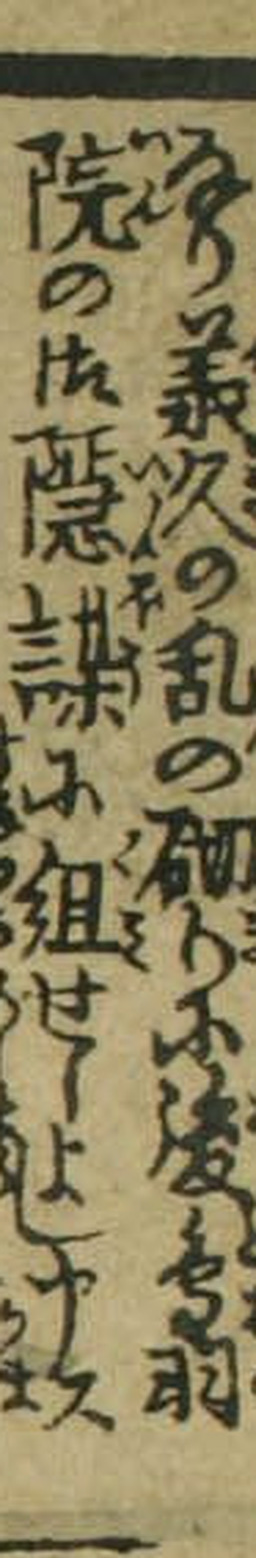院の御隠謀に組せしよし申す
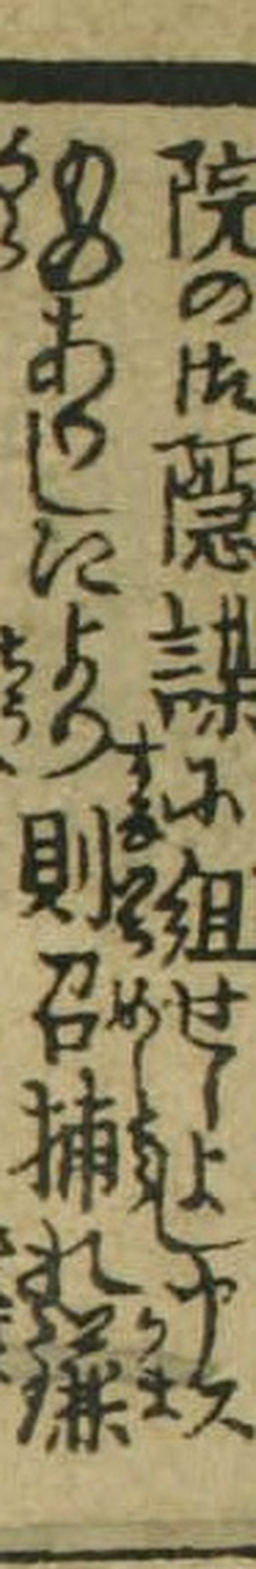ものありしにより則召捕れ鎌
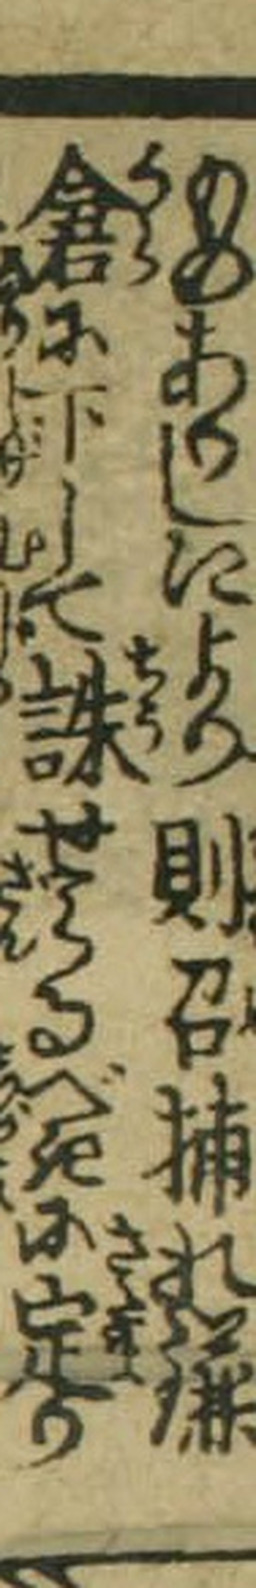倉に下して誅せらるべきに定り
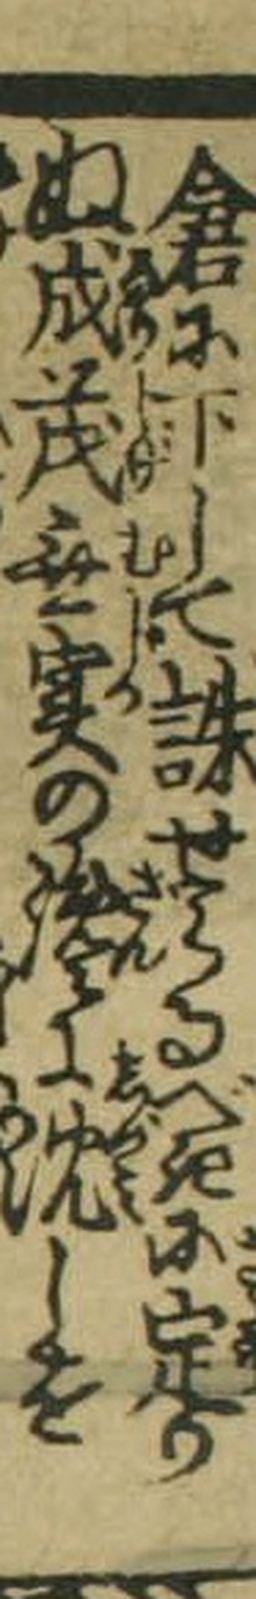ぬ成茂無実の讒に沈しを
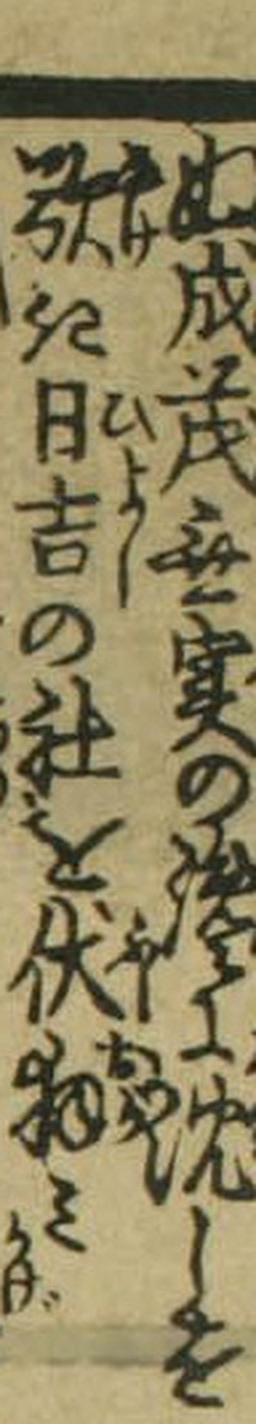歎き日吉の社を伏拝み
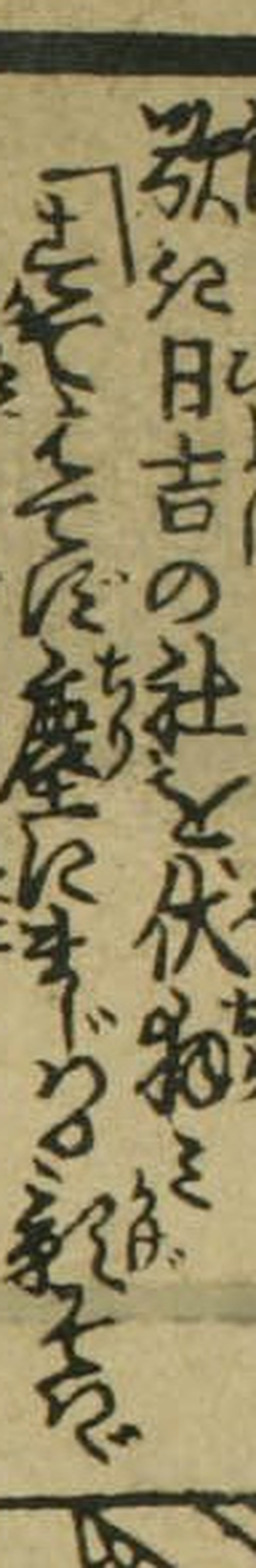〽すてはてず塵にまじはる影そはゞ
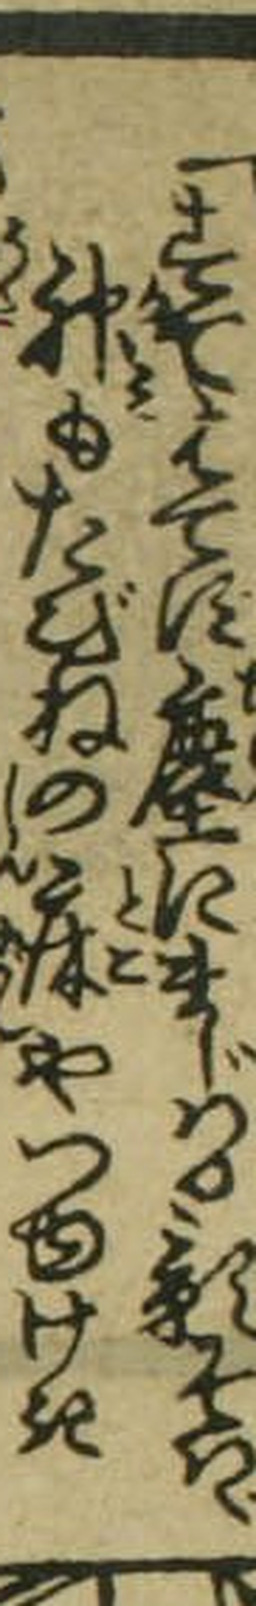神もたびねの床やつゆけき
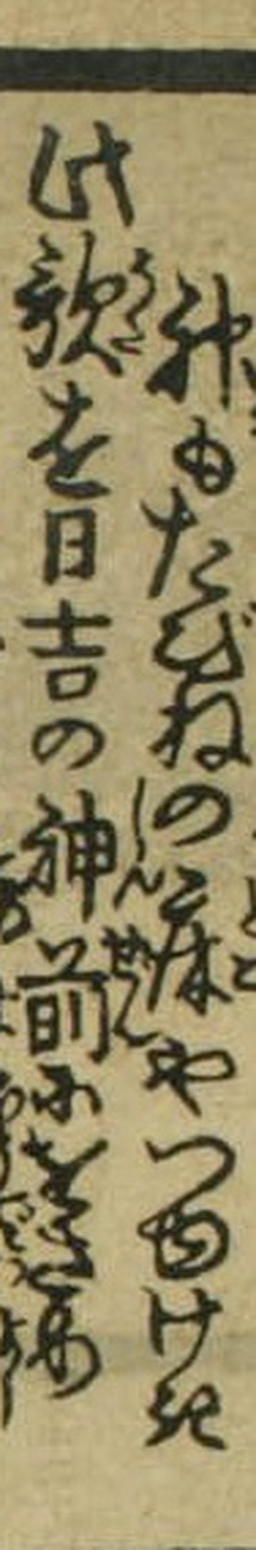此歌を日吉の神前にをさめ
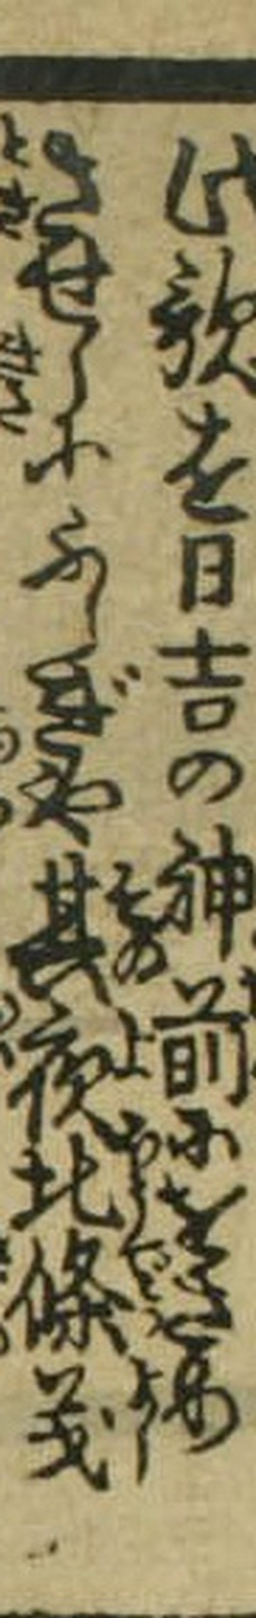させしにふしぎや其夜北条義
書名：續英雄百人一首
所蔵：東京学芸大学附属図書館
